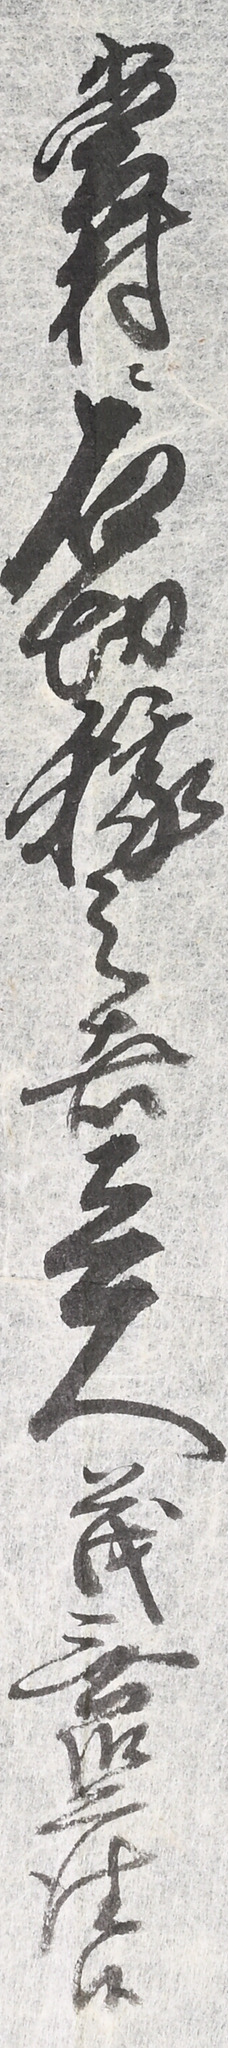当村ニ石切稼之者壱人茂無御座候
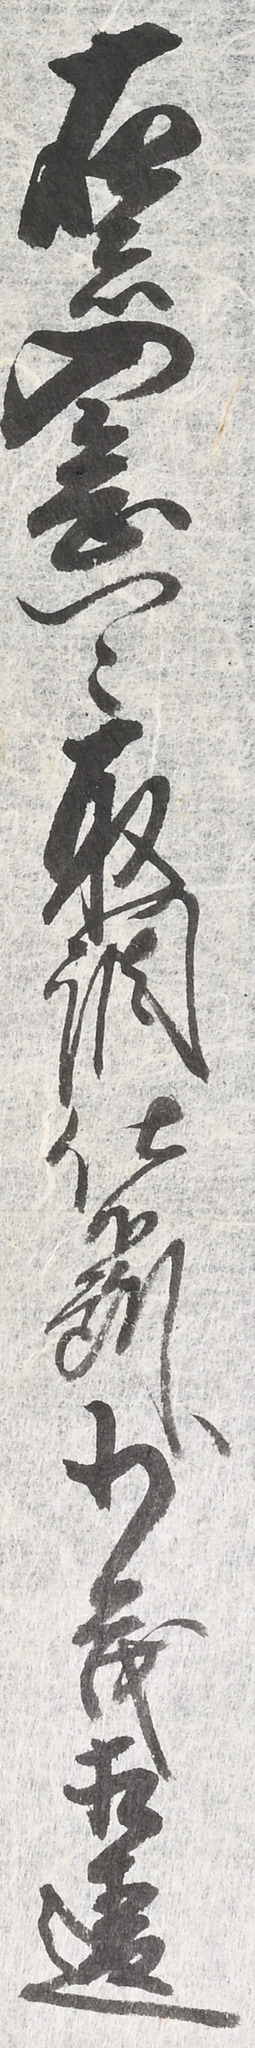右者入念一々取調仕候所少茂相違
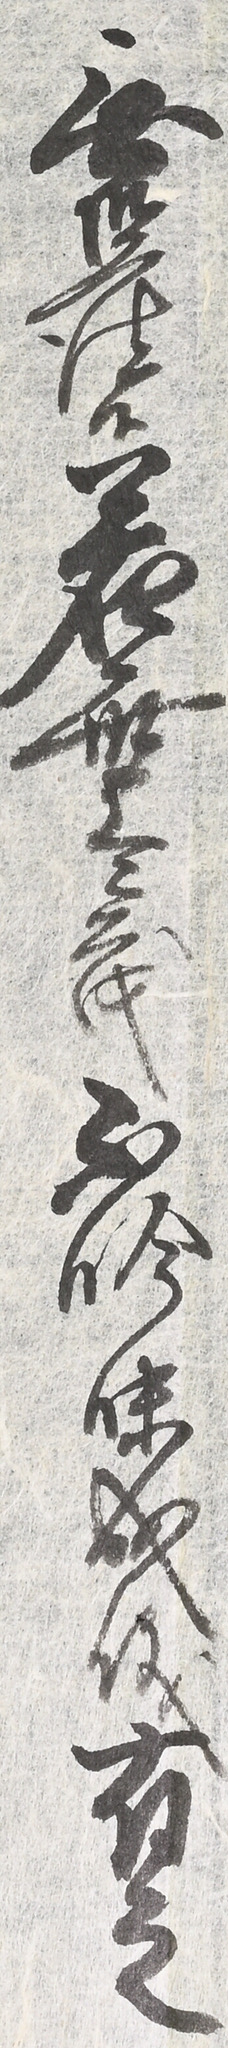無御座候若此上茂不吟味成儀有之
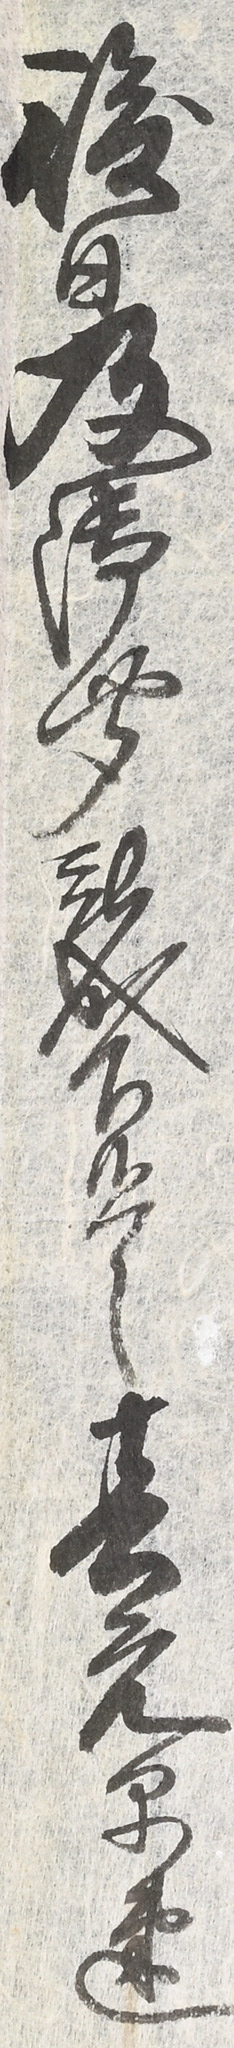後日及御聞被成下候ハヽ其元早速
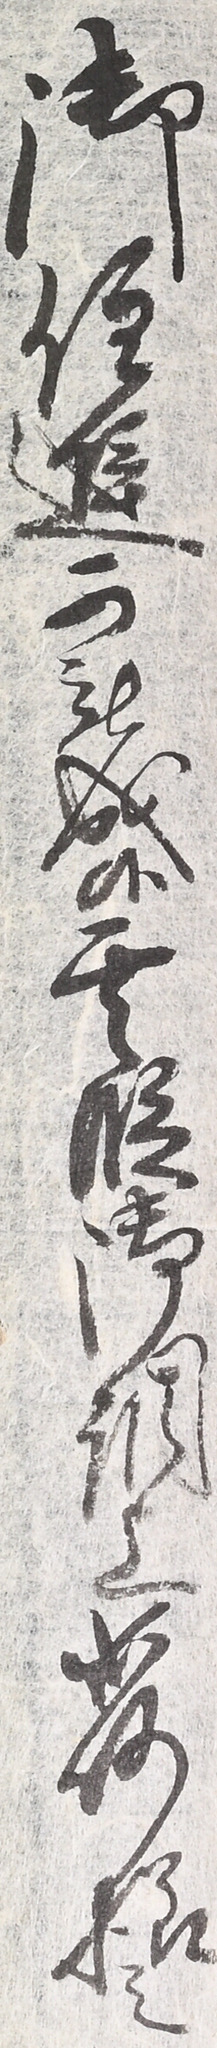御注進可被成候其段御調上如何様之
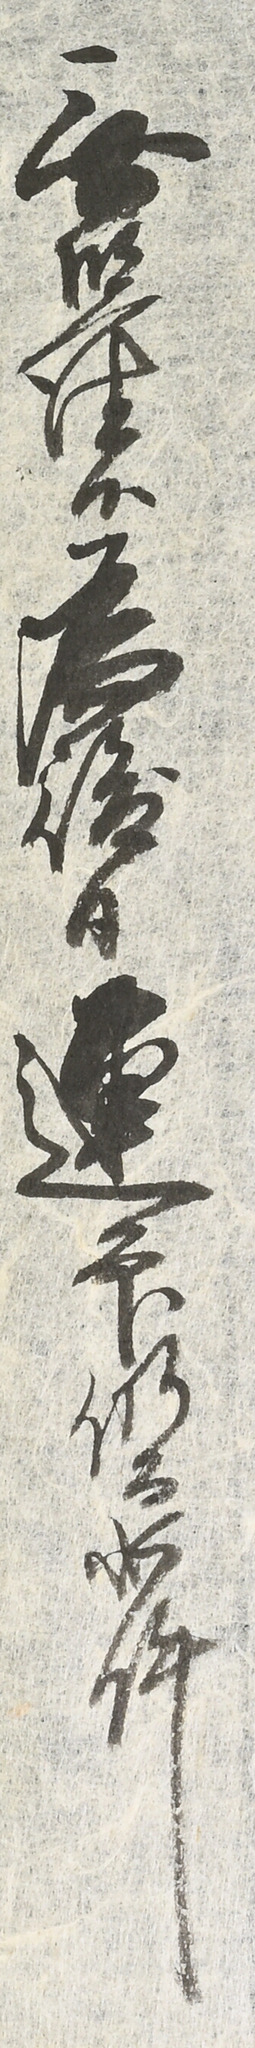無御座候為後日連印仍而如件
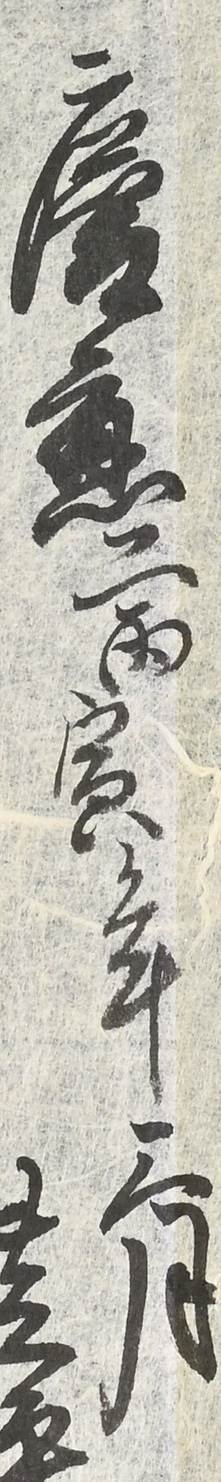慶応二丙寅年三月
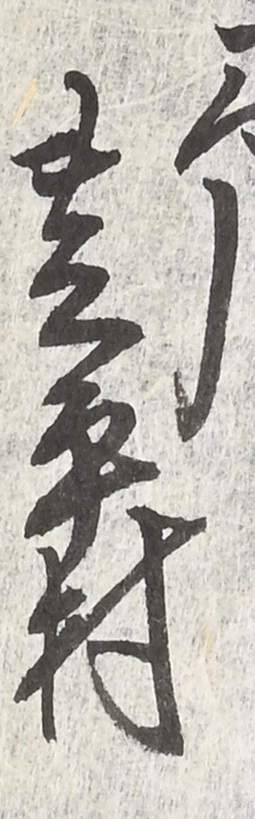芝平村
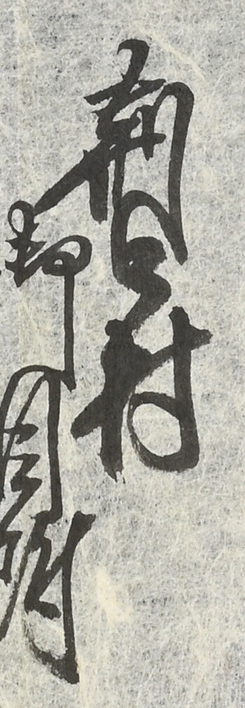荊口村
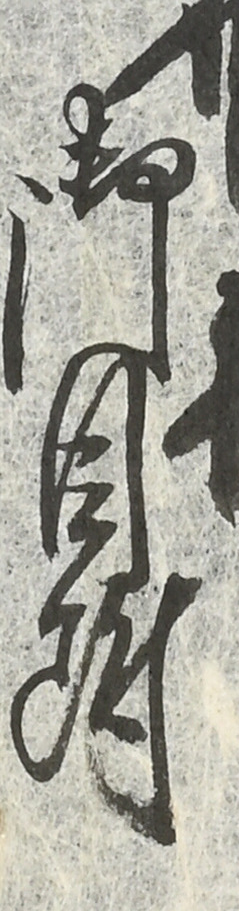御目附
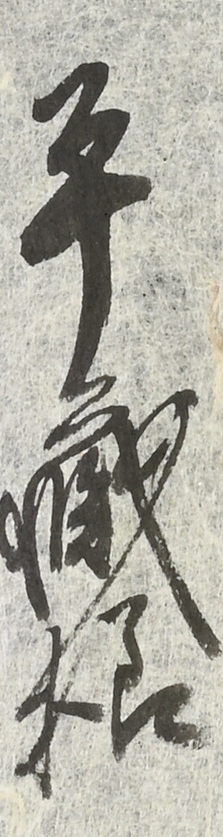平蔵様
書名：差出シ申一札之事
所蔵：伊那市立高遠町図書館・合同会社AMANE
